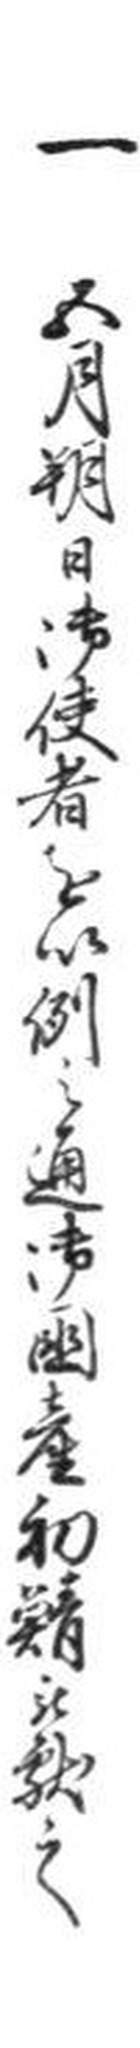一五月朔日御使者を以例之通御国産初鯖被献之
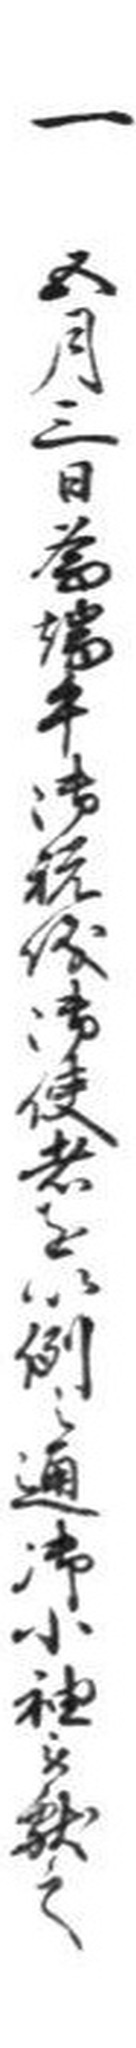一五月三日為端午御祝儀御使者を以例之通御小袖被献之
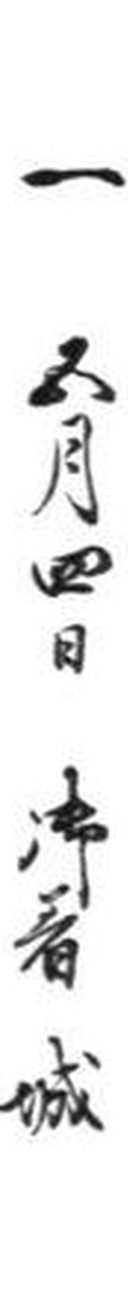一五月四日御着城
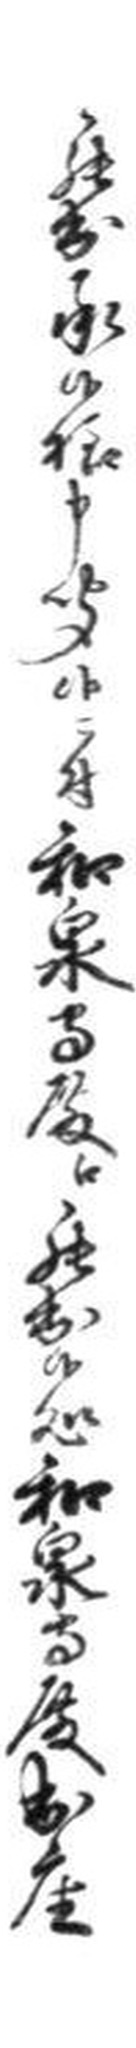罷出承候様申聞候ニ付和泉守殿江罷出候処和泉守殿出座
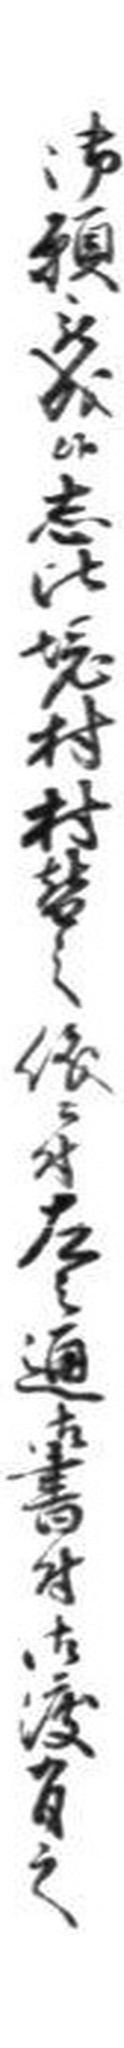御願被成候志比境村替之儀ニ付左之通御書付御渡有之
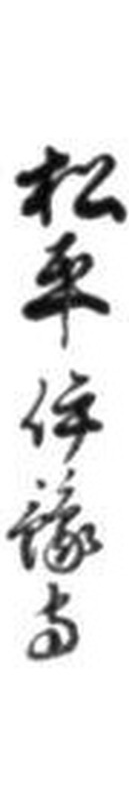松平伊予守
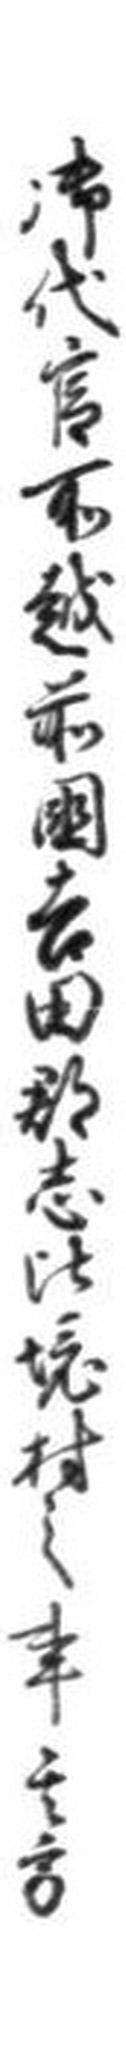御代官所越前国吉田郡志比境村之事其方
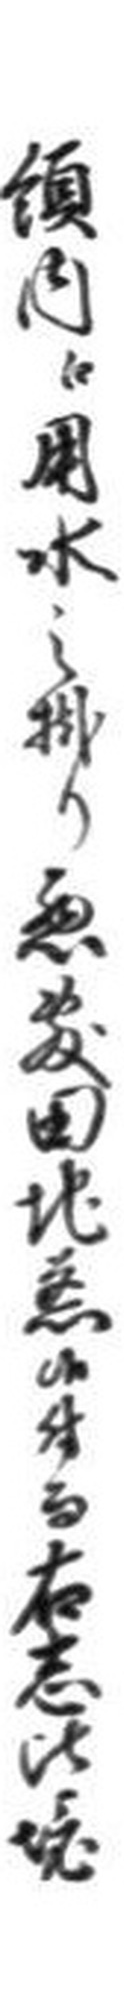領内江用水之掛り悪敷田地荒候付而右志比境
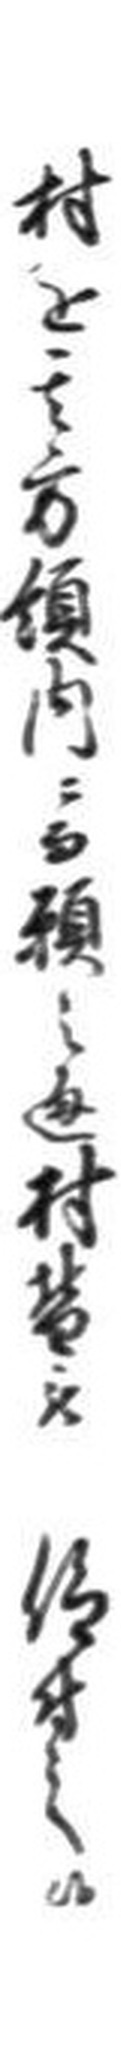村を其方領内ニ而願之通村替被仰付之候
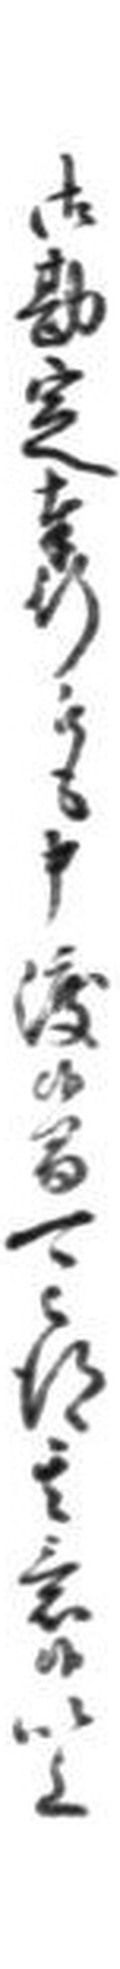御勘定奉行江も申渡候間可被得其意候以上
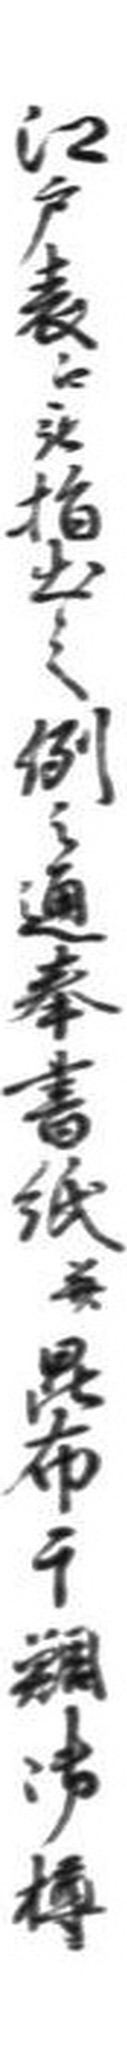江戸表江被指出之例之通奉書紙并昆布干鯛御樽
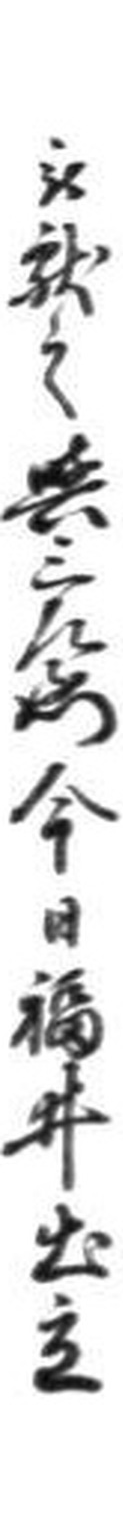被献之与三左衛門今日福井出立
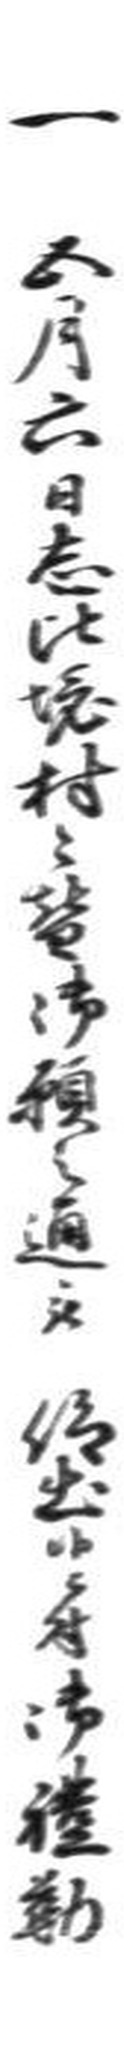一五月六日志比境村々替御願之通被仰出候ニ付御礼勤
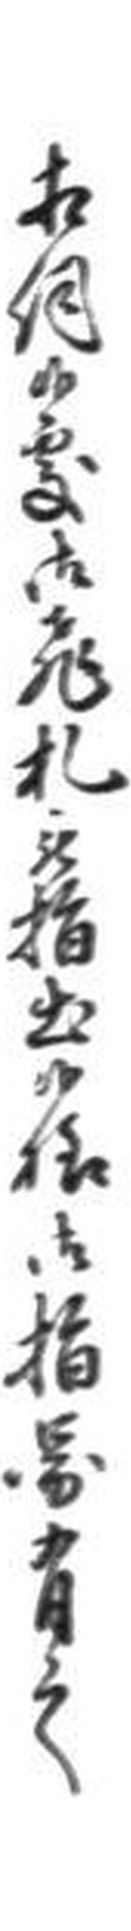相伺候処御飛札被指出候様御指図有之
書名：家譜 三十三 吉邦公 享保四年
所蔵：福井県文書館 Fukui Prefectural Archives
